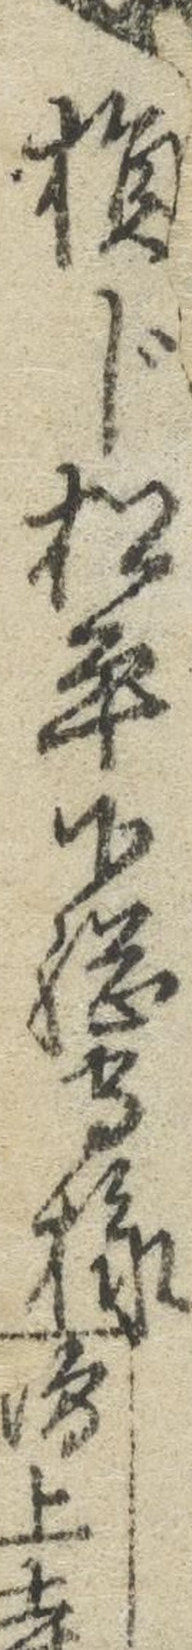損じ松平下総守様増上寺
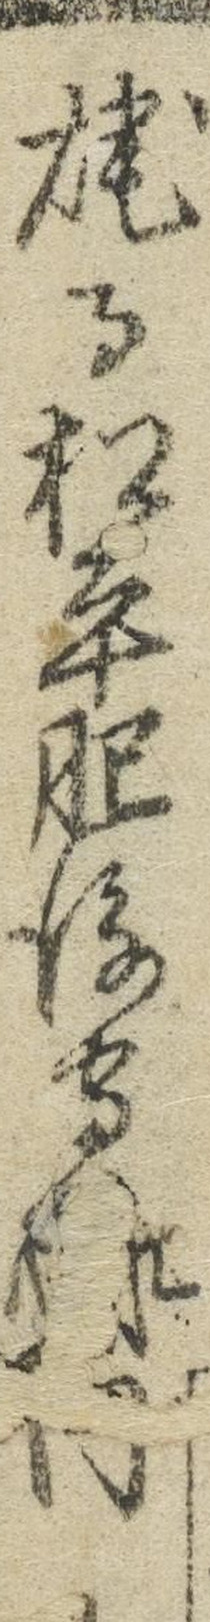焼る松平肥後守様
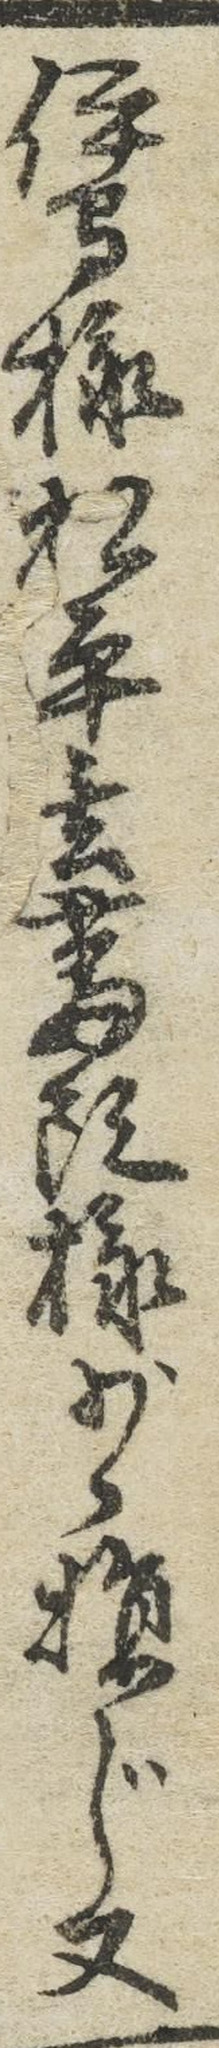伊守様松平玄蕃頭様少々損じ又
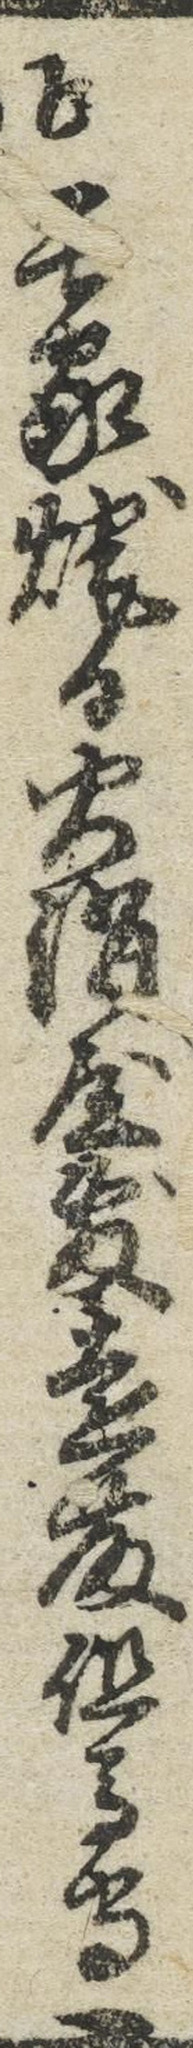御長家焼る火消屋敷遠藤但馬守
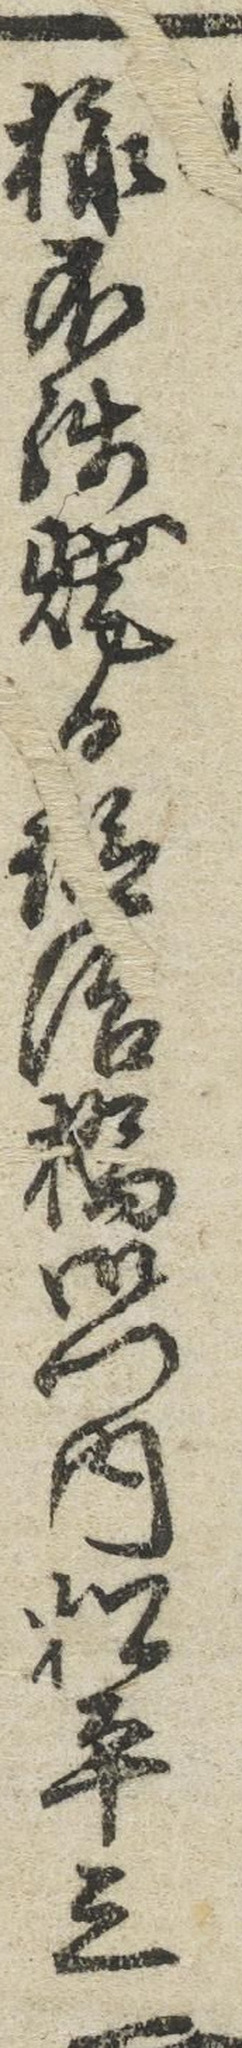様不残焼る鍛冶橋御門内松平三
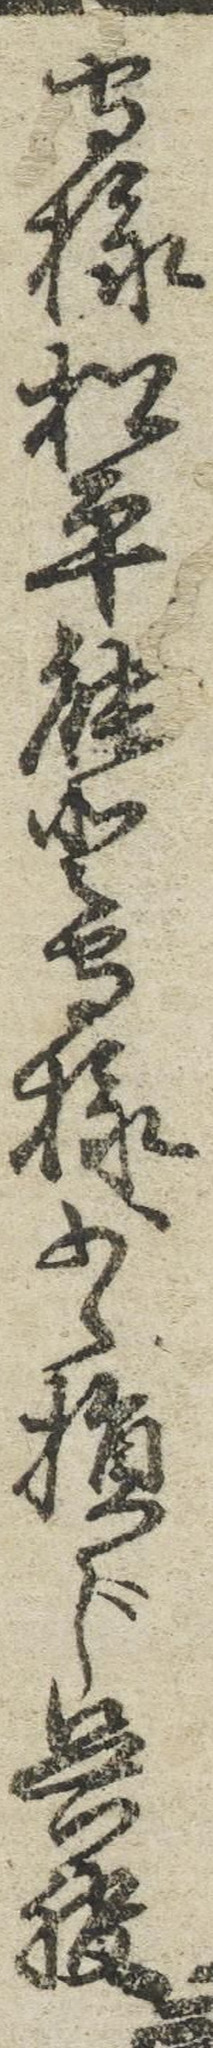守様松平能登守様少々損じ呉服
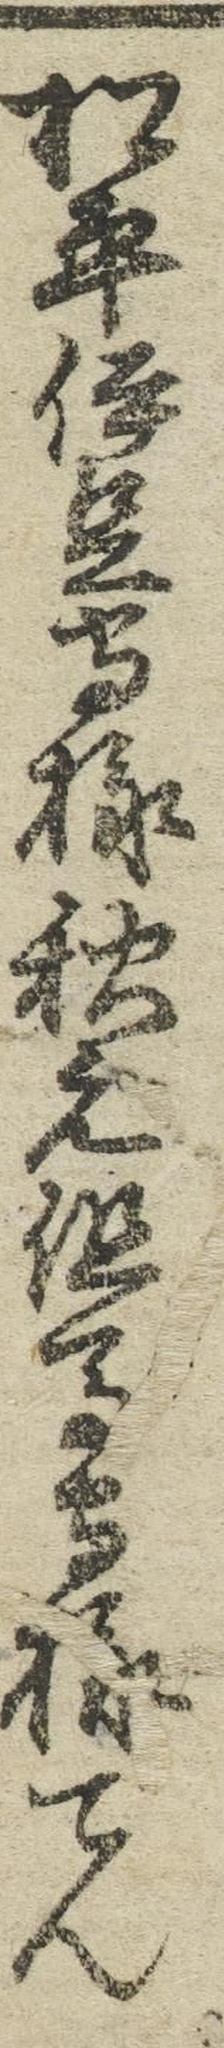松平伊豆守様秋元但馬守様てん
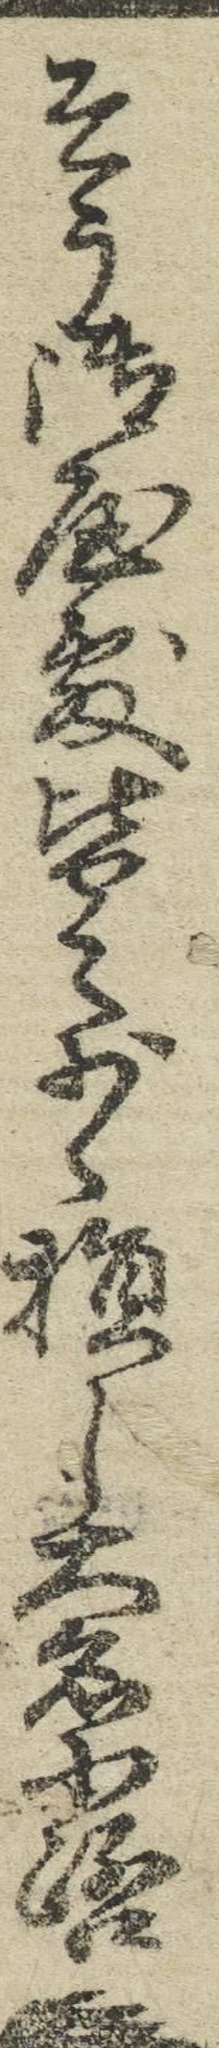そう御屋敷皆〻少〻損し大名小路口

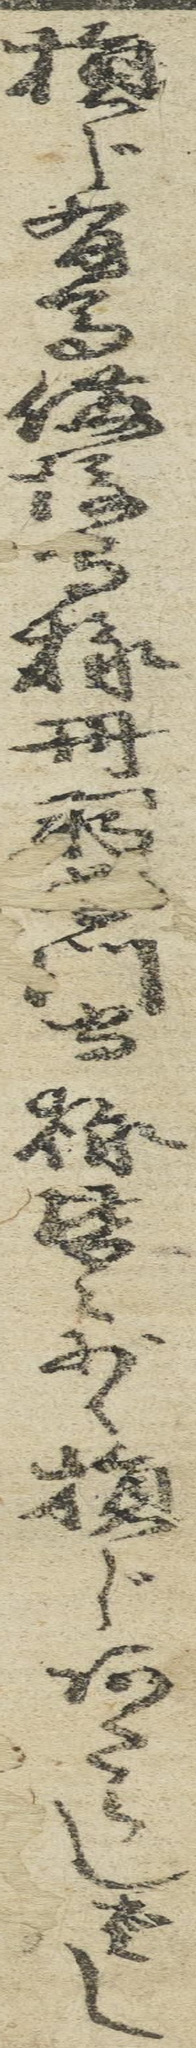損じ有馬備後守様丹羽長門守様皆〻少〻損じあたらしばし
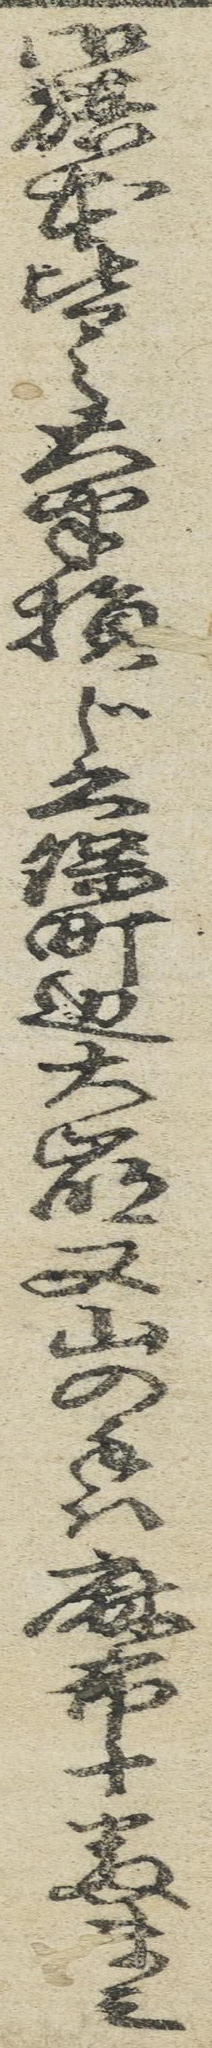御旗本皆〻大半損じ久保町辺大崩又山の手ハ麻布十番まみ
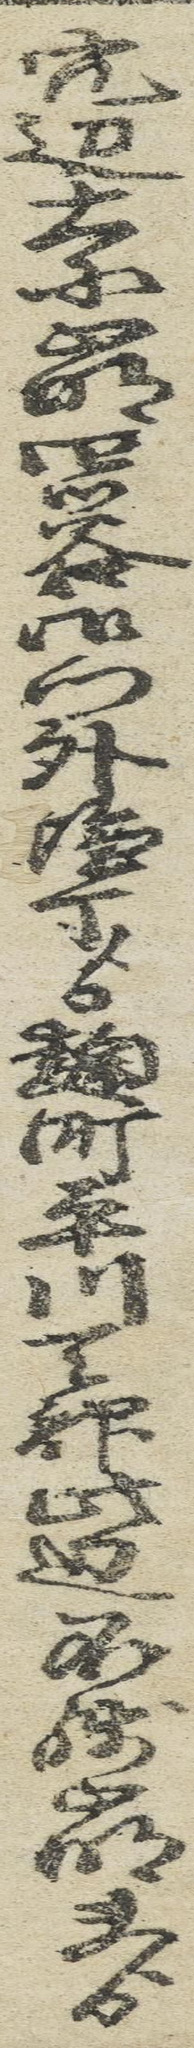穴辺大に崩四ツ谷御門外塩丁ゟ麹町平川天神此辺不残崩夫ゟ
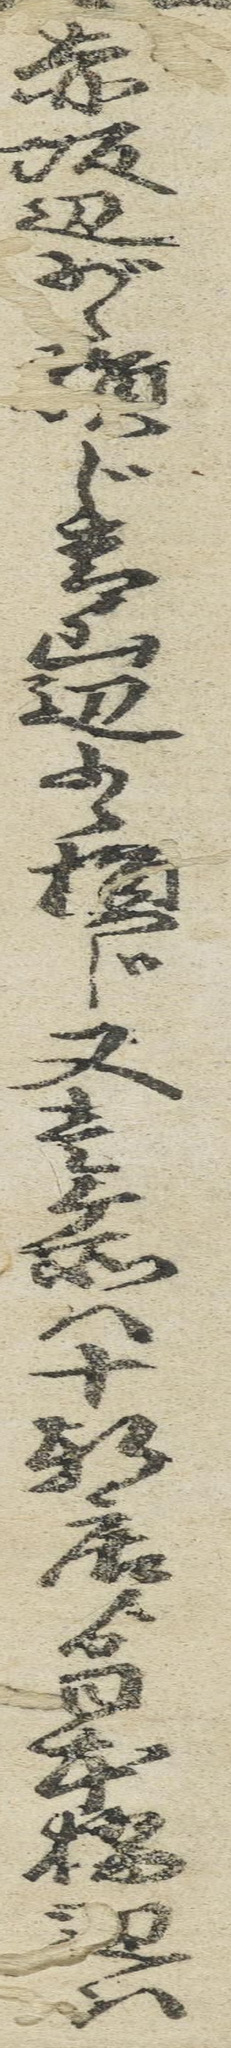赤坂辺少〻損じ青山辺少〻損じ又壱ケ所ハ十軒店ゟ日本橋辺ハ
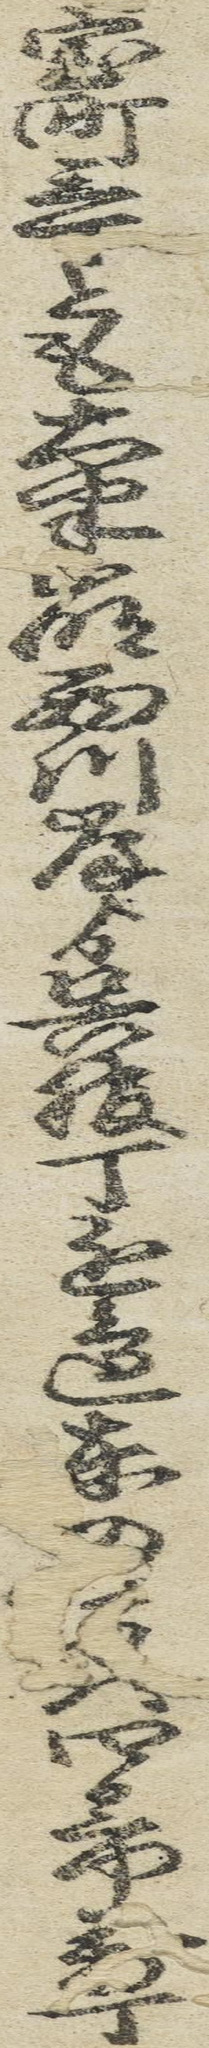室町三丁とも大半崩西川岸ゟ呉服丁近辺東の方？ハ四日市万丁
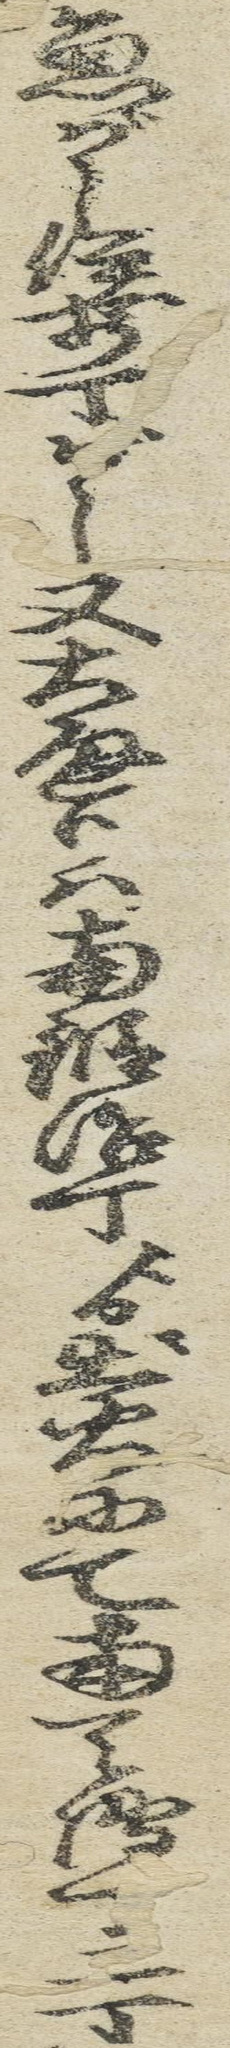魚がし伊勢丁がし又大通りハ南鍛冶町ゟ出火にて南天伝丁ニ丁
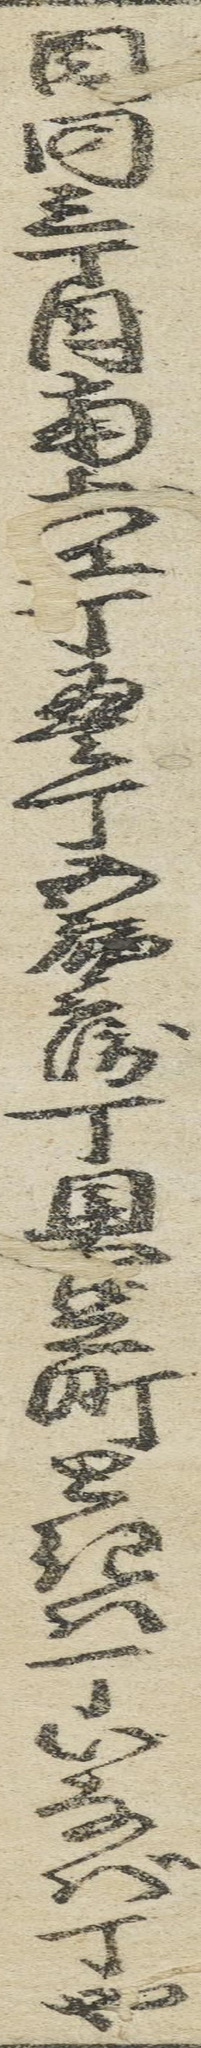目同三丁目南大工丁畳丁五郎兵衛丁具足町ときハ丁いなバ丁や
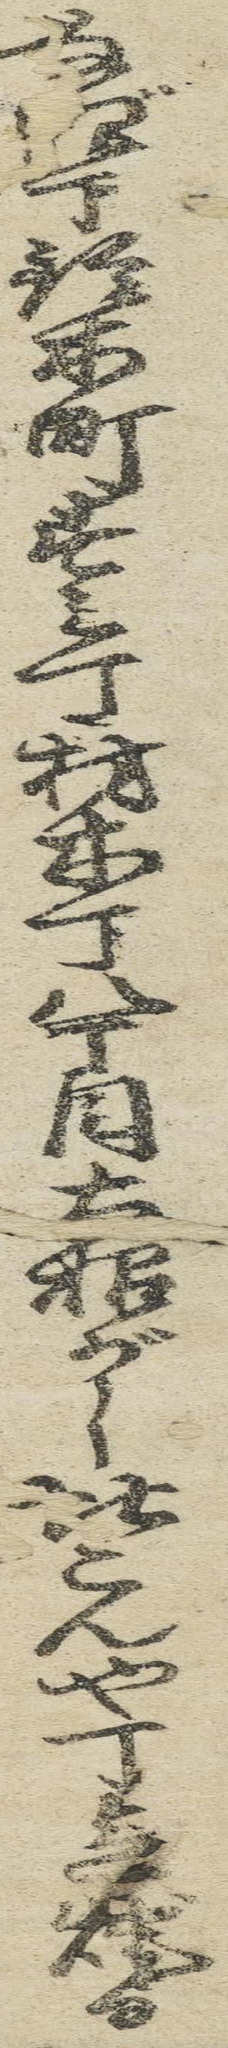なぎ丁鈴木町すみ丁材木丁八丁目大根がし北こんや丁迄焼る
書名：関東五街道　江戸大地震出火場所
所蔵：東京大学地震研究所図書室 Earthquake Research Institute Library, The University of Tokyo, JAPAN
